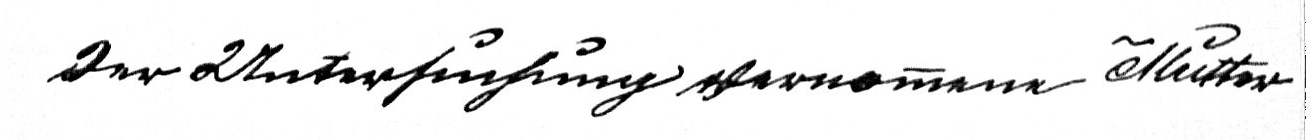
der Untersuchung vernommene Mutter
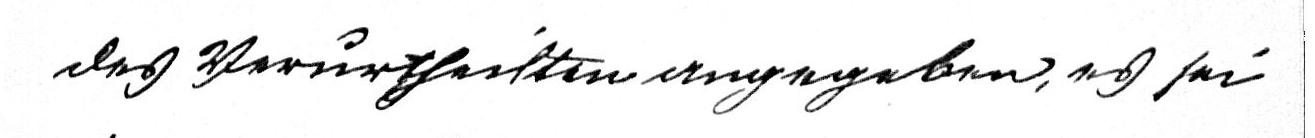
des Verurtheilten angegeben, es sei
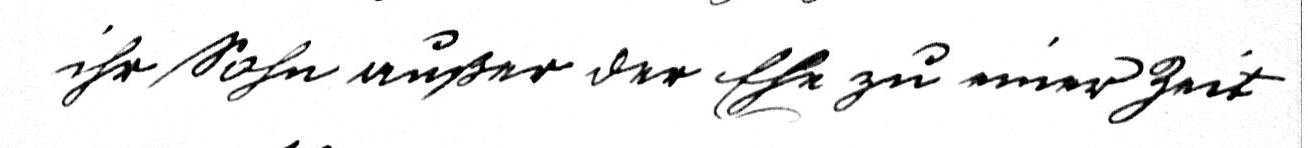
ihr Sohn außer der Ehe zu einer Zeit
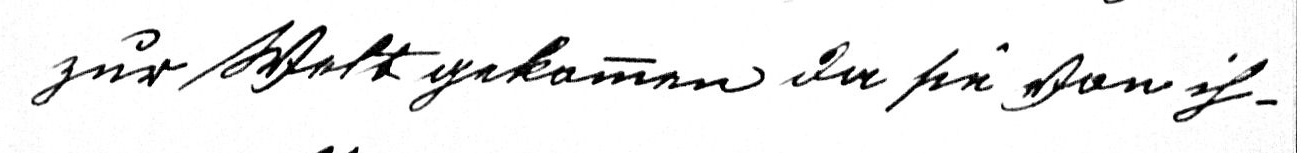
zur Welt gekommen da sie von ih¬
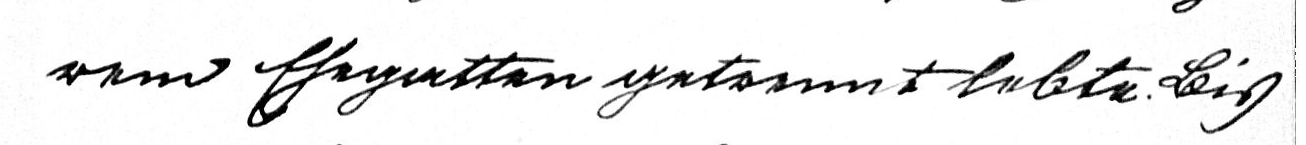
rem Ehegatten getrennt lebte. Bis
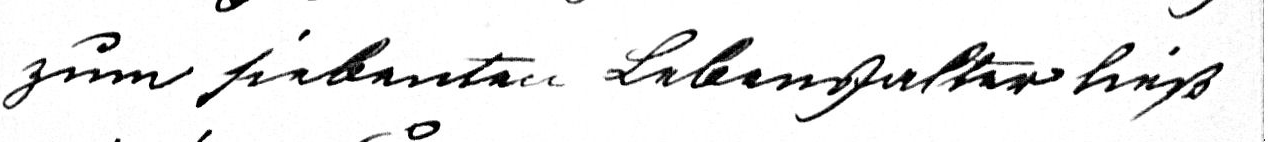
zum siebenten Lebensalter ließ
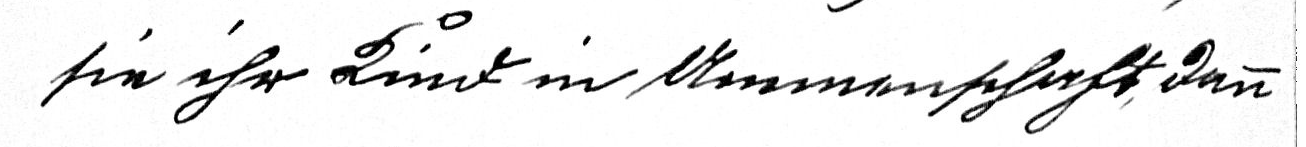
sie ihr Kind in Ammenschaft, dann
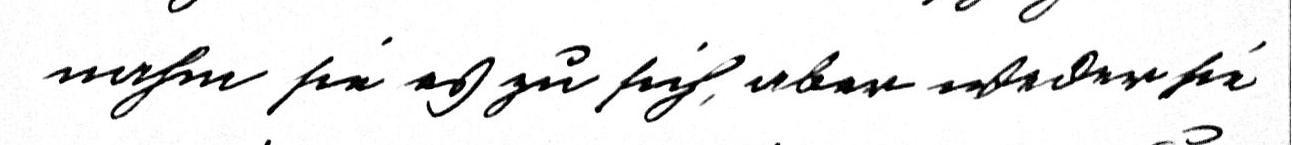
nahm sie es zu sich, aber weder sie
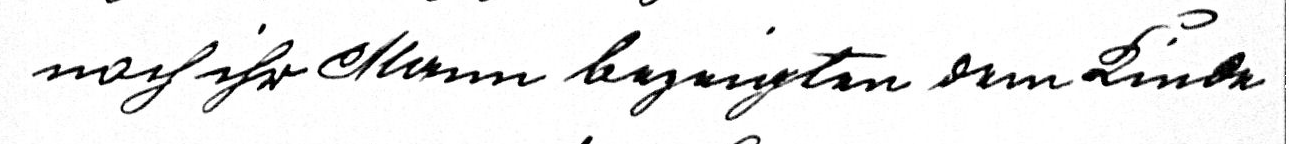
noch ihr Mann bezeigten dem Kinde
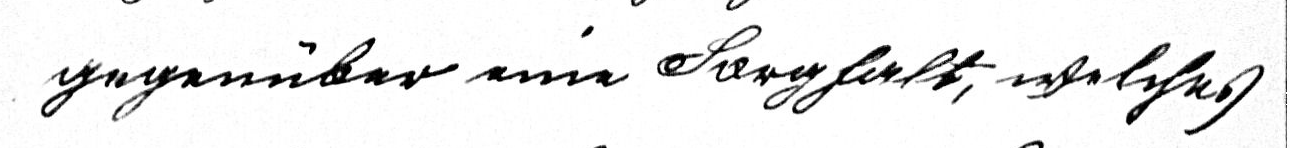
gegenüber eine Sorghalt, welches
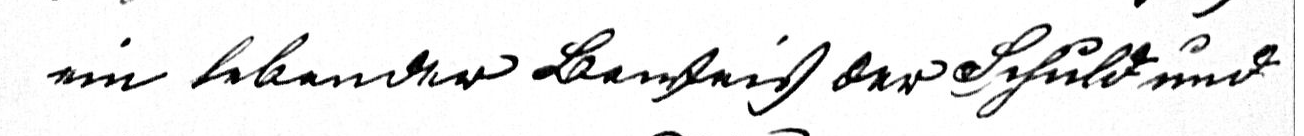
ein lebender Beweis der Schuld und
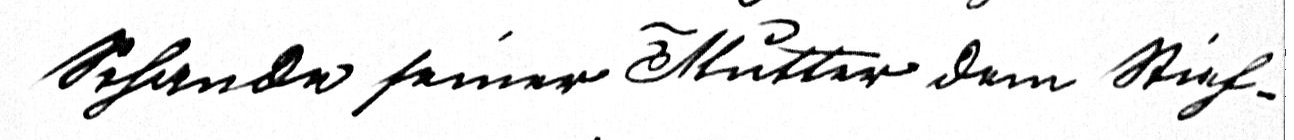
Schande seiner Mutter dem Stief¬
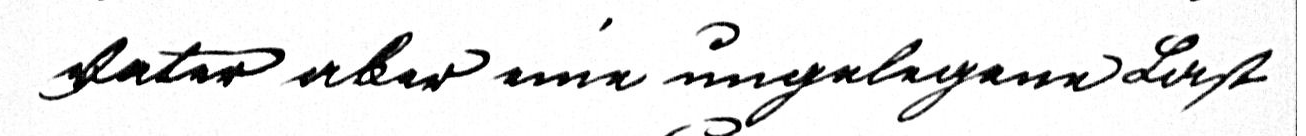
vater aber eine ungelegene Last
